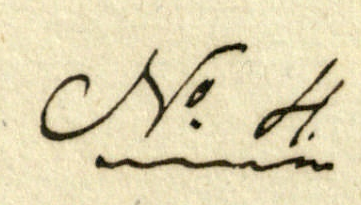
Nº 4
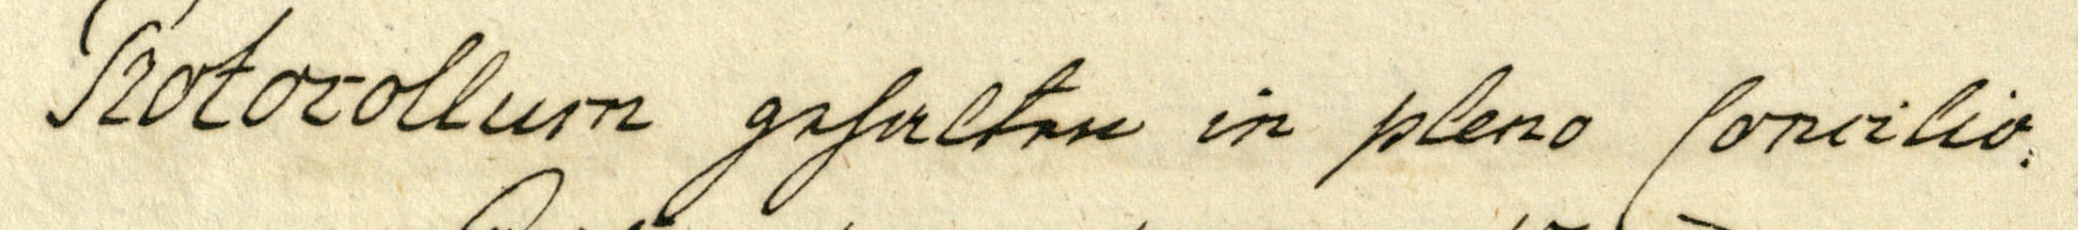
Protocollum gehalten in pleno Cocilio.
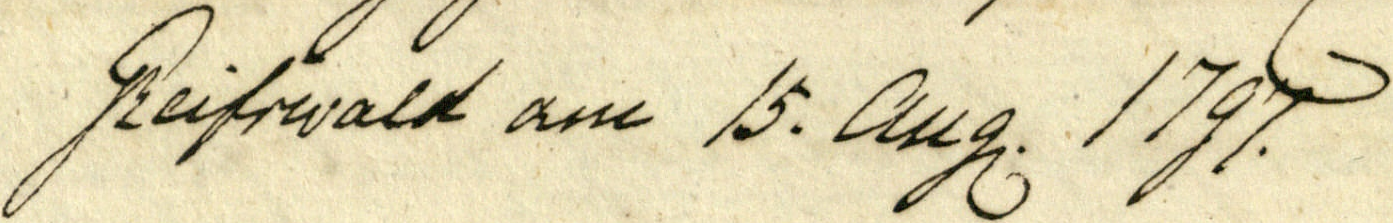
Greifswald am 15. Aug. 1797.
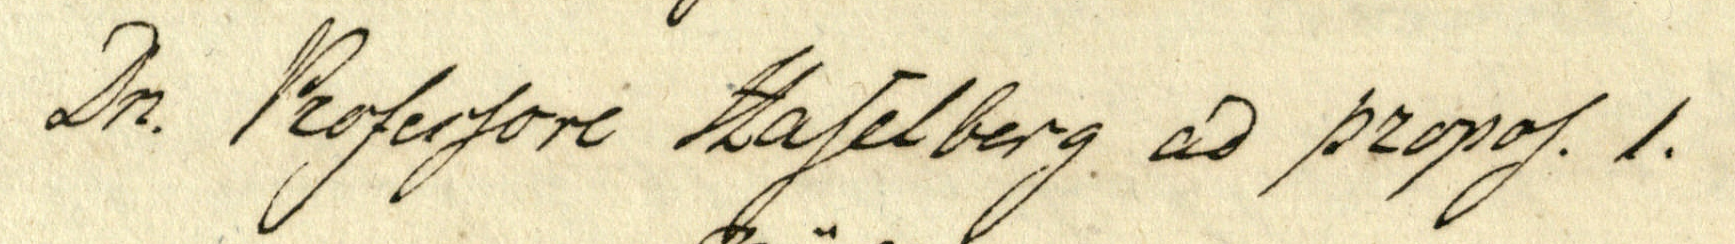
Dn. Professore Haselberg ad. propos. 1.
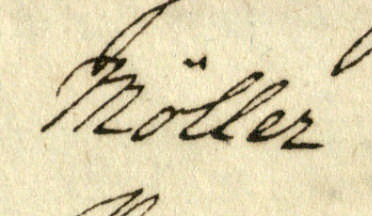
Möller
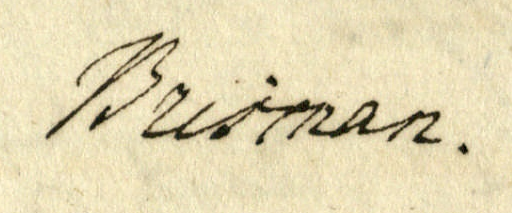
Brisman.
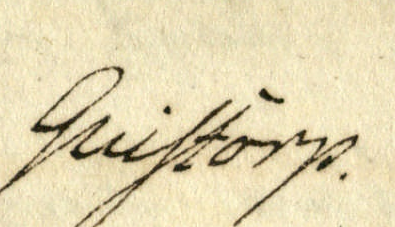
Quistorp.
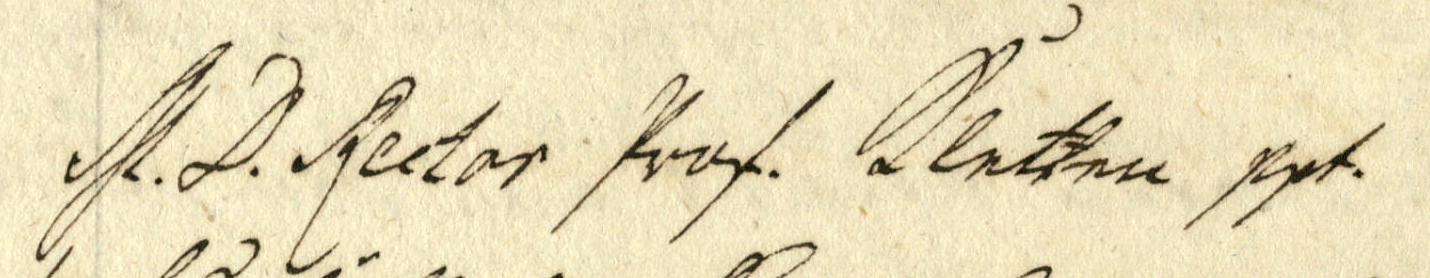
M. D. Rector Prof. Kletten ppt.
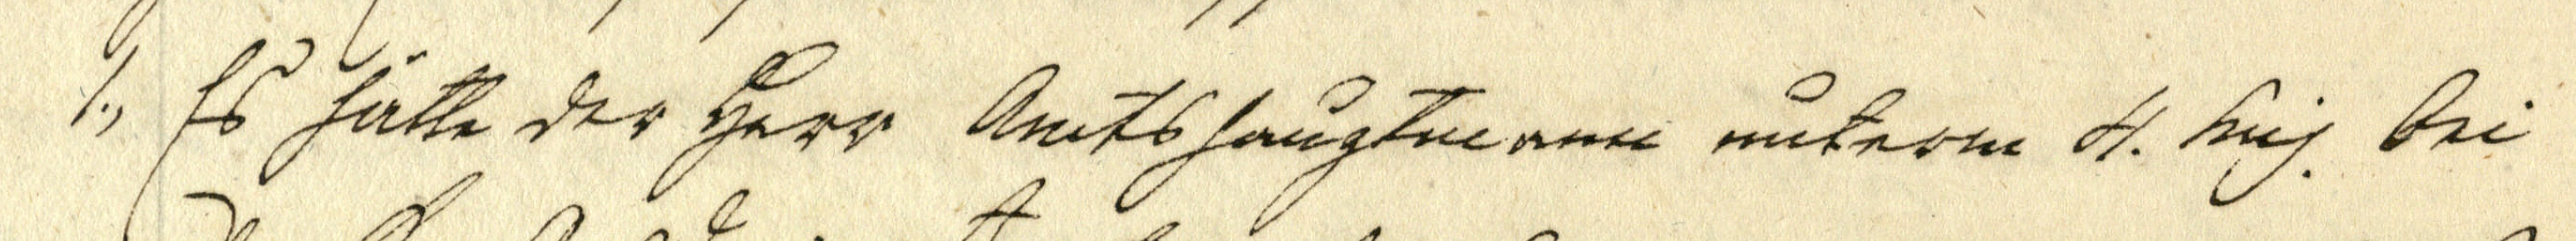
1., Es hätte der Herr Amtshauptmann unterm 4. huj. bei
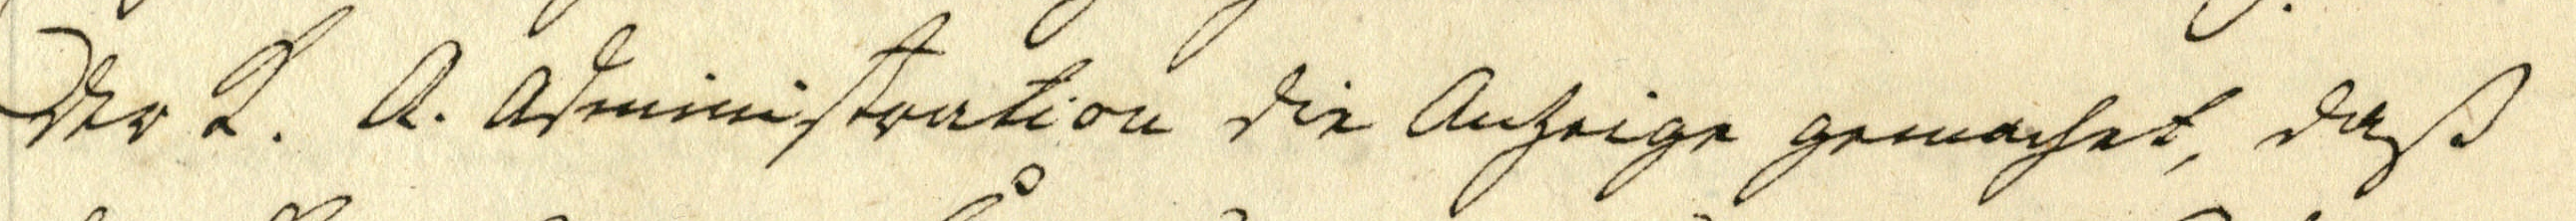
der K. A. Administration die Anzeige gemacht, daß
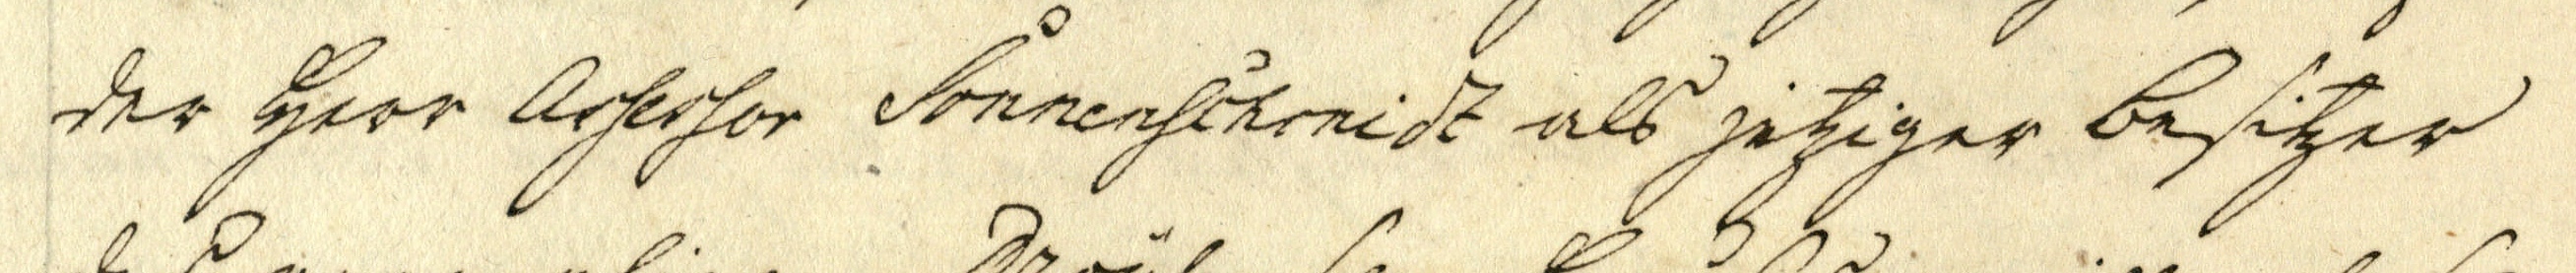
der Herr Assessor Sonnenschmidt als jetziger Besitzer
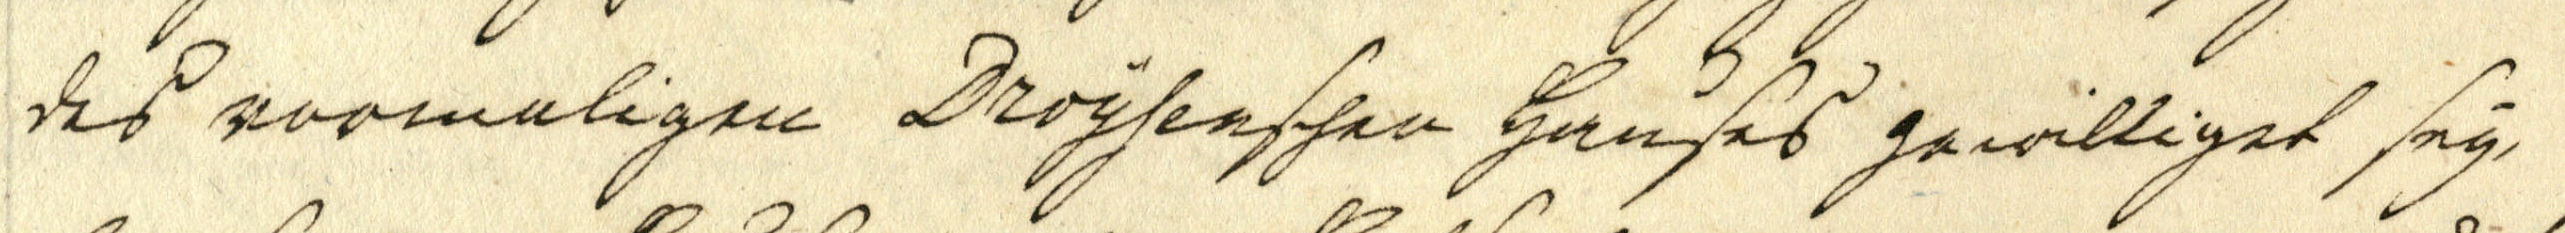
des vormaligen Droÿsenschen Hauses gewilliget seÿ
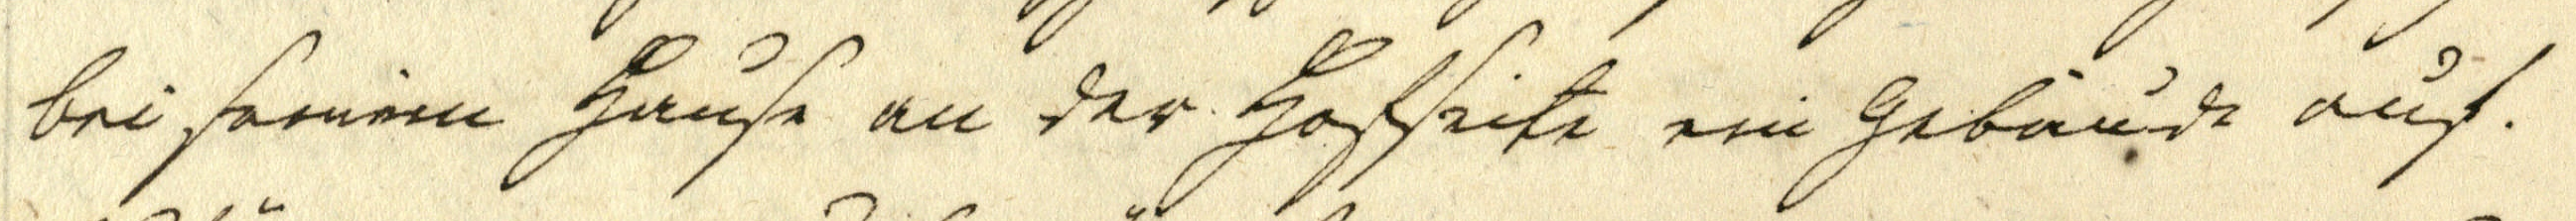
bei seinem Hause an der Hofseite ein Gebäude auf¬
